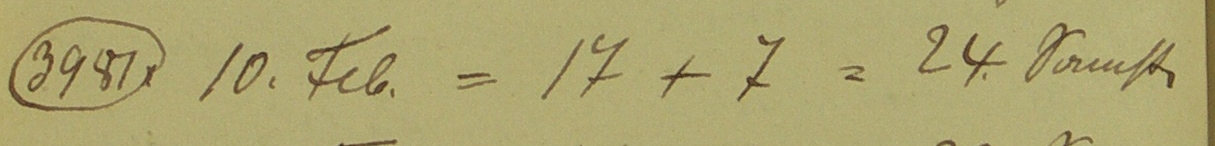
3981. 10. Febr. = 17 + 7 = 24 Samstag
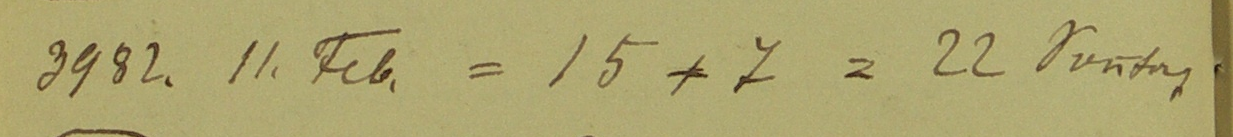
3982. 11. Febr. = 15 + 7 = 22 Sonntag
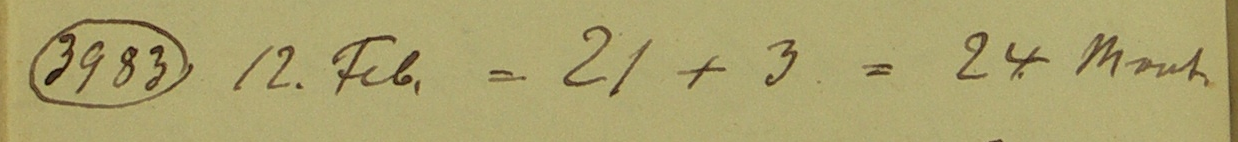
3983. 12. Febr. = 21 + 3 = 24 Montag
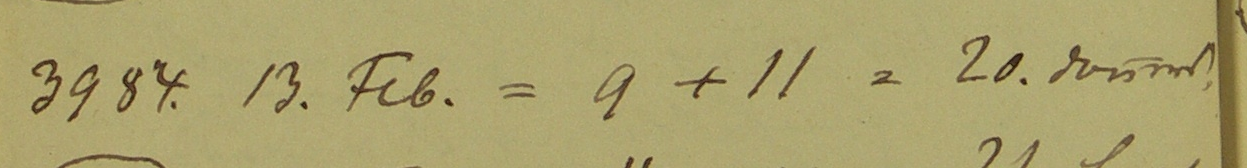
3983. 13. Febr. = 9 + 11 = 20 Donnerstag
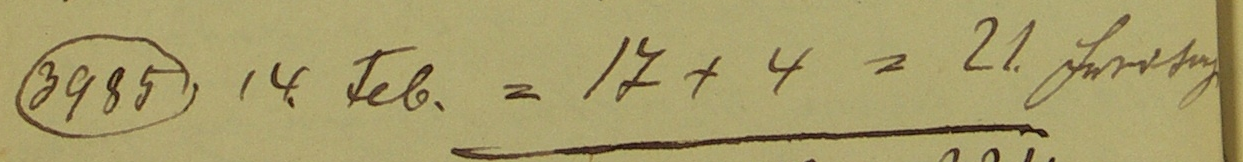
3984. 14. Febr. = 17 + 4 = 21 Freitag
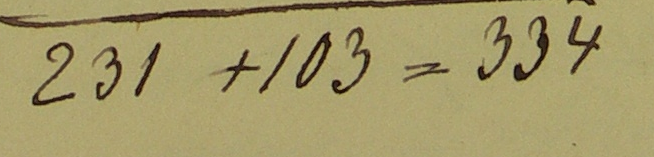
231 + 103 = 334
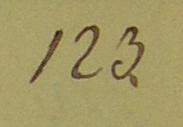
123
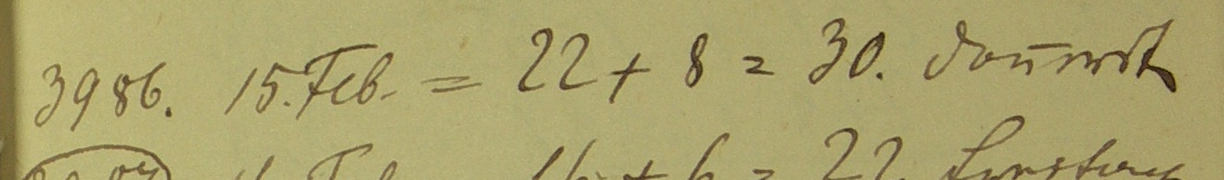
3986. 15. Febr. = 22 + 8 = 30 Donnerstag
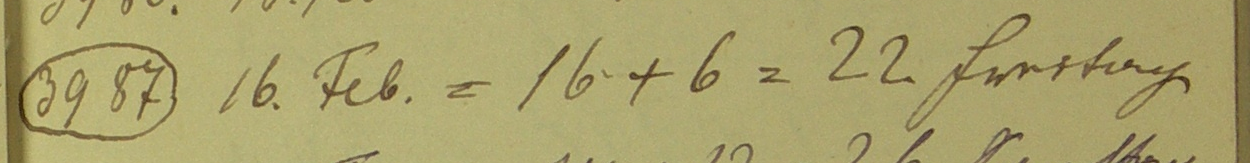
3987. 16. Febr. = 16 + 6 = 22 Freitag
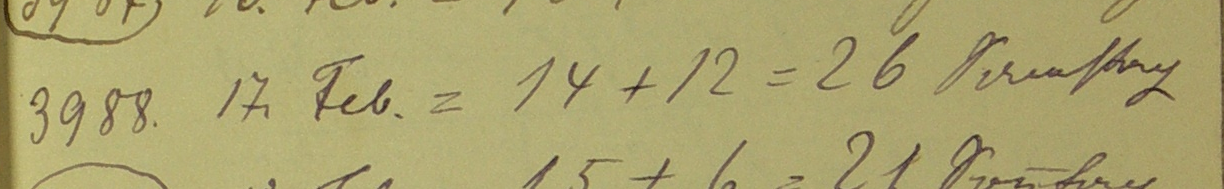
3988. 17. Febr. = 14 + 12 = 26 Samstag
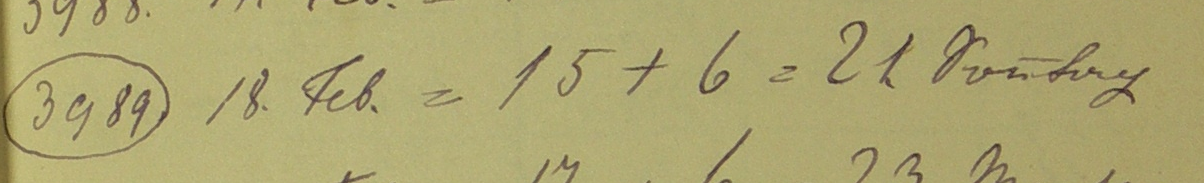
3989. 18.Febr. = 15 + 6 = 21 Sonntag
